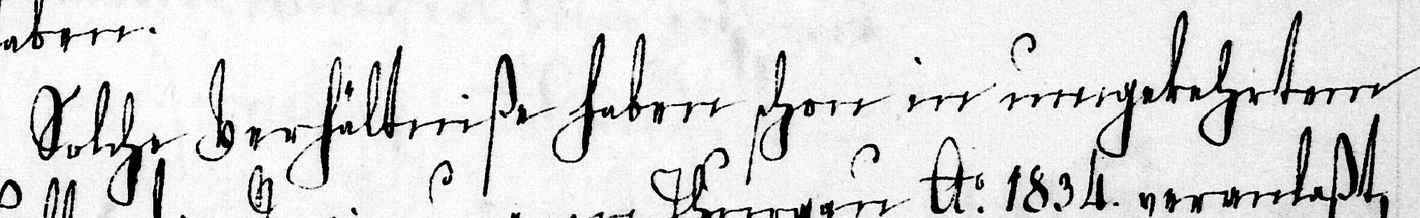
Solche Verhältniße haben schon in umgekehrtem
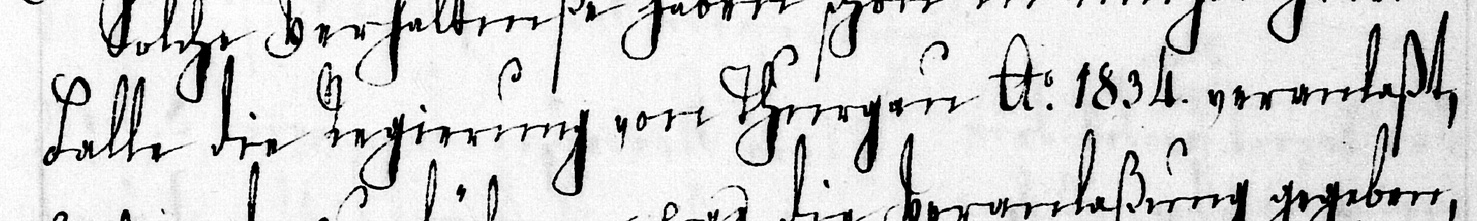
Falle die Regierung von Thurgau Ao. 1834. veranlaßt,
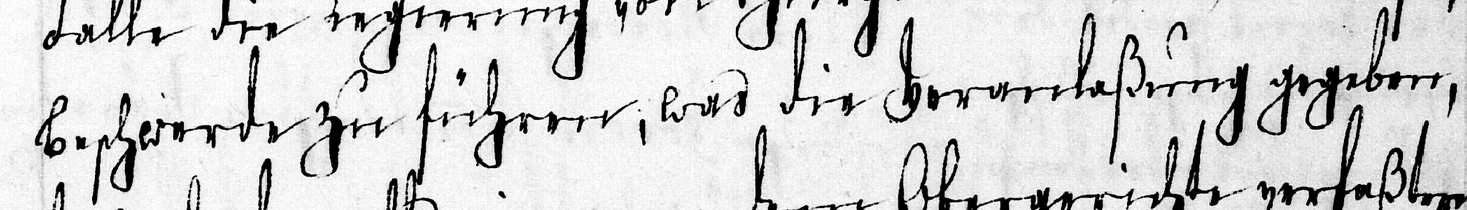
Beschwerde zu führen, was die Veranlaßung gegeben,
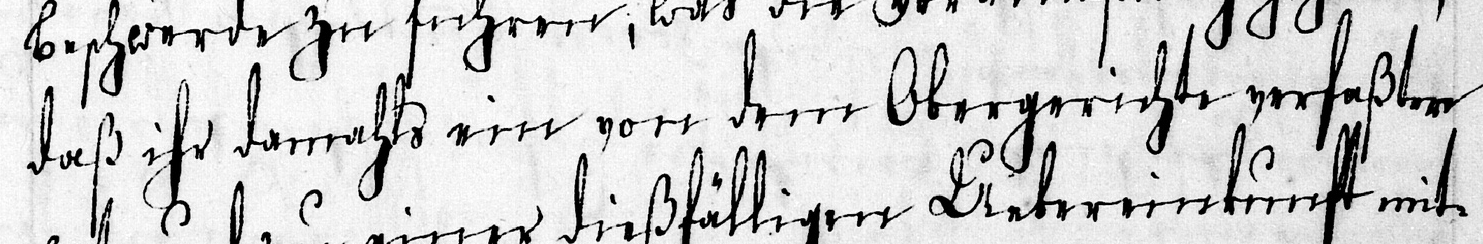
daß ihr damahls ein von dem Obergerichte verfaßter
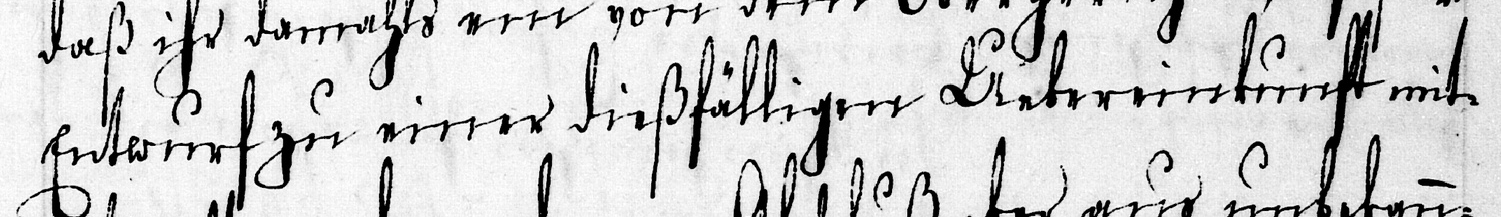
Entwurf zu einer dießfälligen Uebereinkunft mit¬
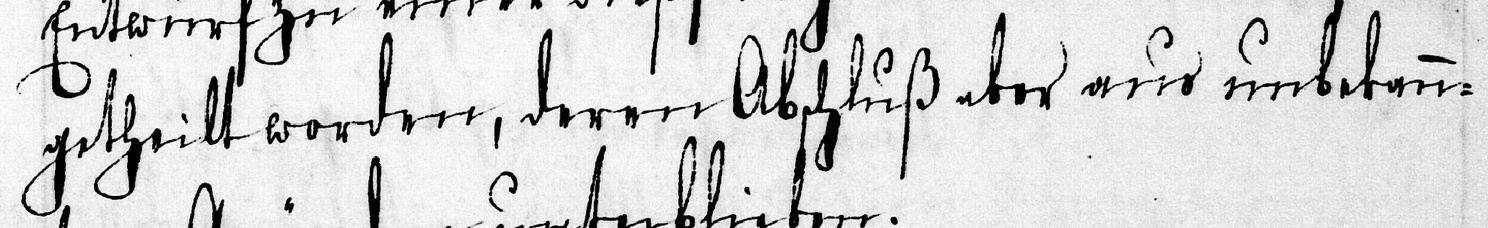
getheilt worden, deren Abschluß aber aus unbekann¬
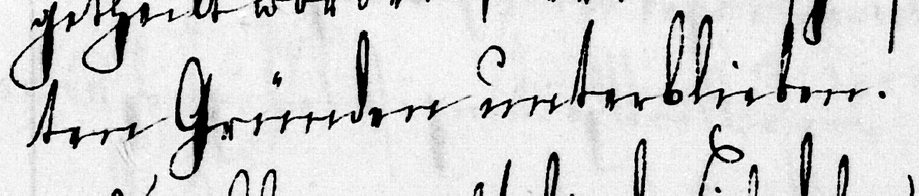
ten Gründen unterblieben.
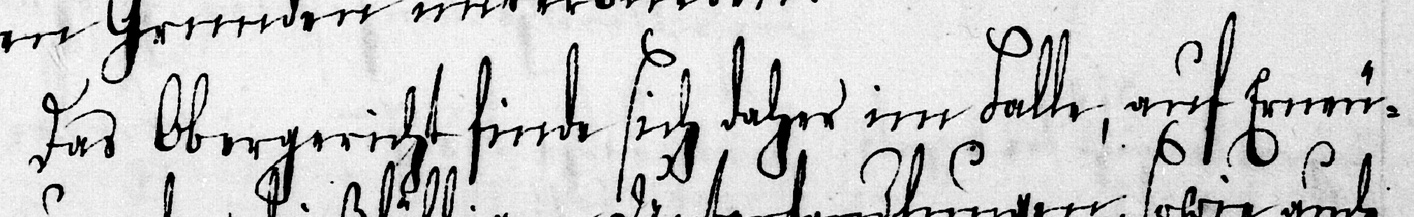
Das Obergericht finde sich daher im Falle, auf Erneu¬
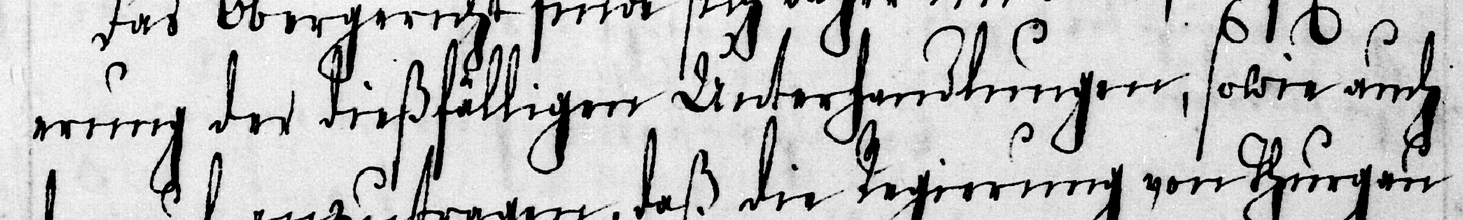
erung der dießfälligen Unterhandlungen, sowie auch
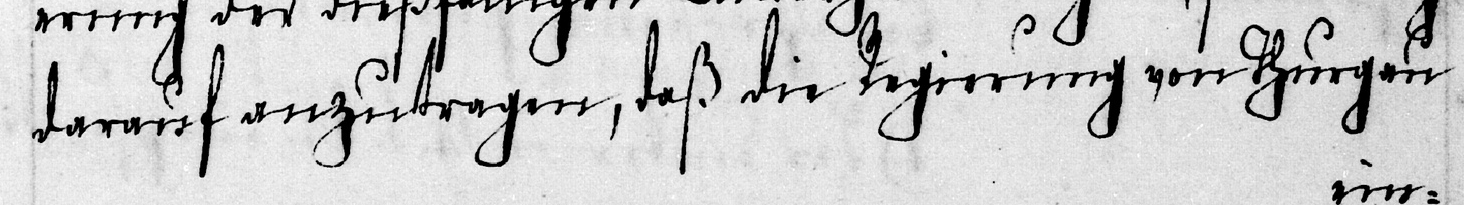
darauf anzutragen, daß die Regierung von Thurgau
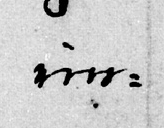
ein
